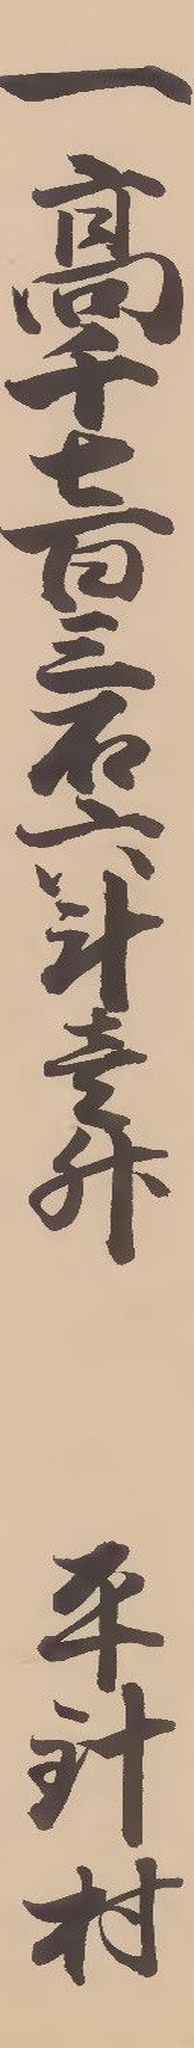一高千七百三石六斗壱升平針村
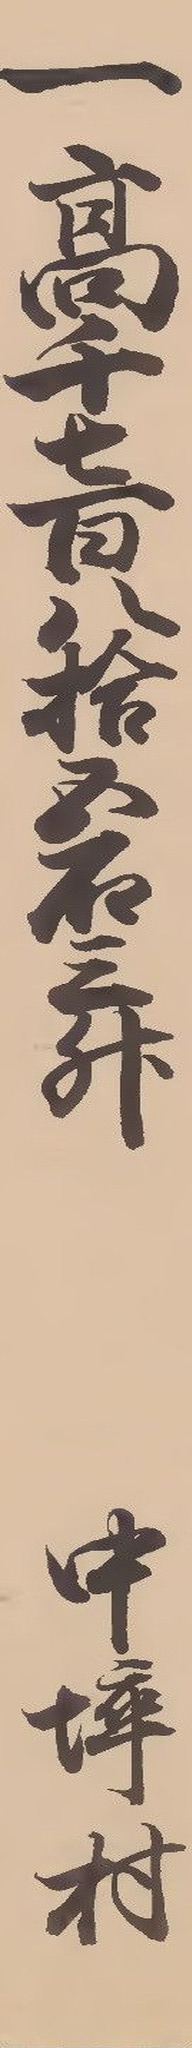一高千七百八拾五石三升中埣村
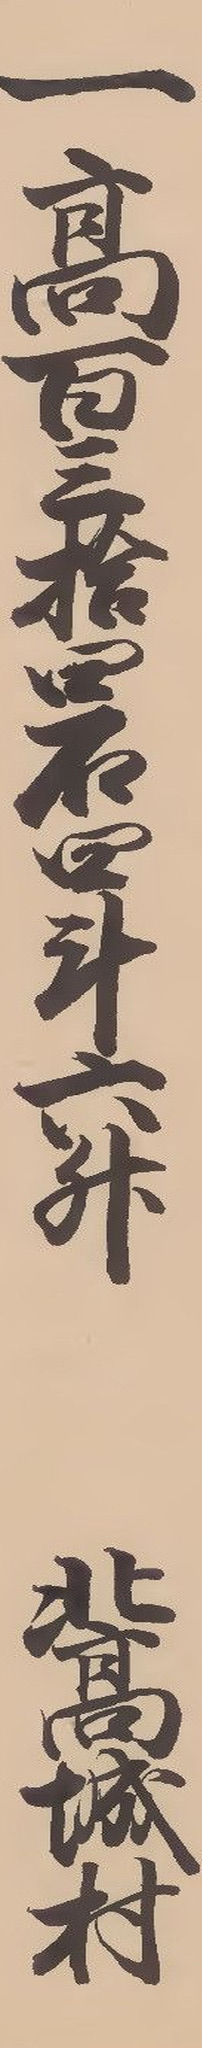一高百三拾四石四斗六升北高城村
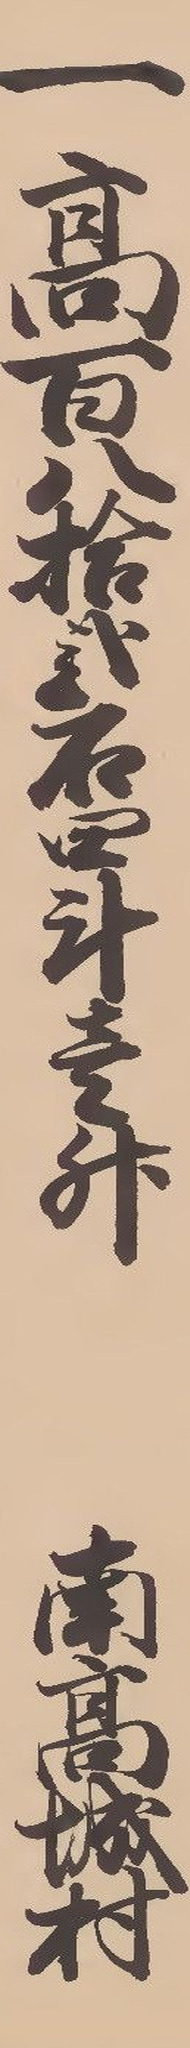一高百八拾弐石四斗壱升南高城村
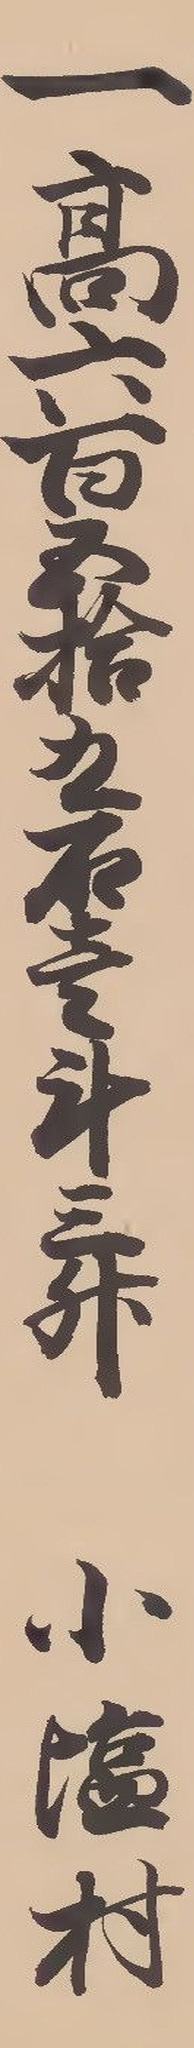一高六百五拾九石壱斗三升小塩村
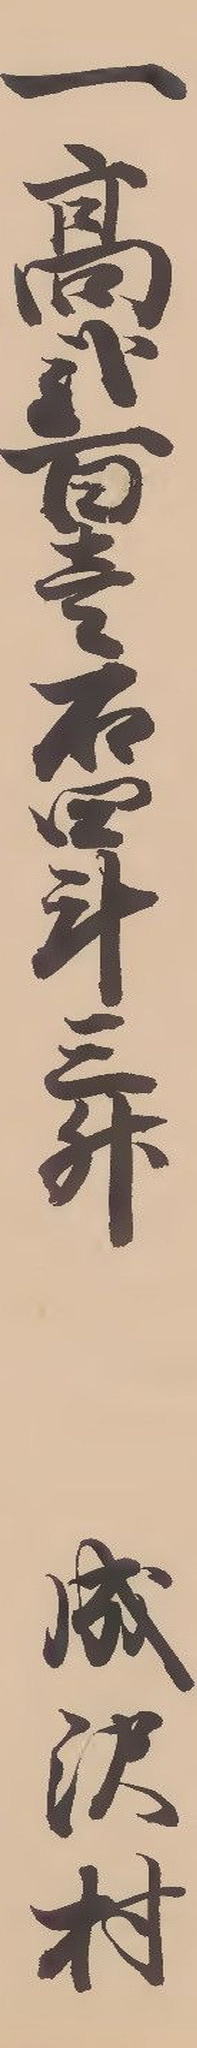一高弐百壱石四斗三升成沢村
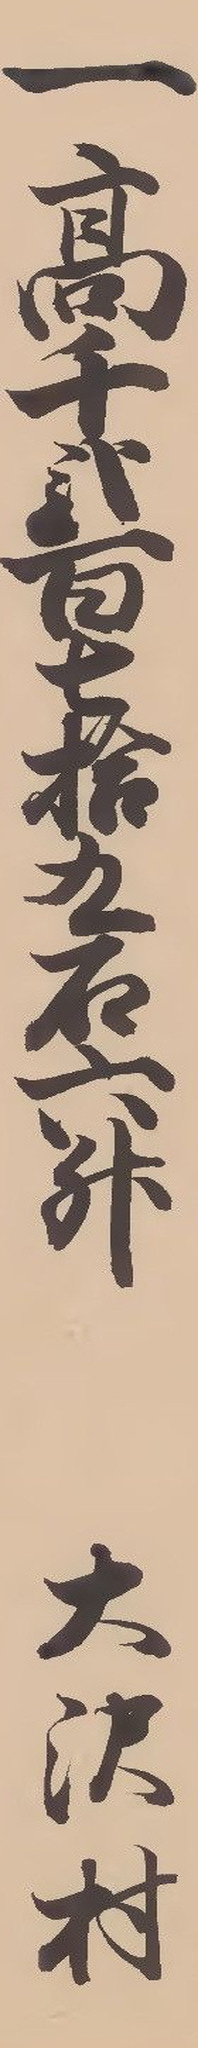一高千弐百七拾九石六升大沢村
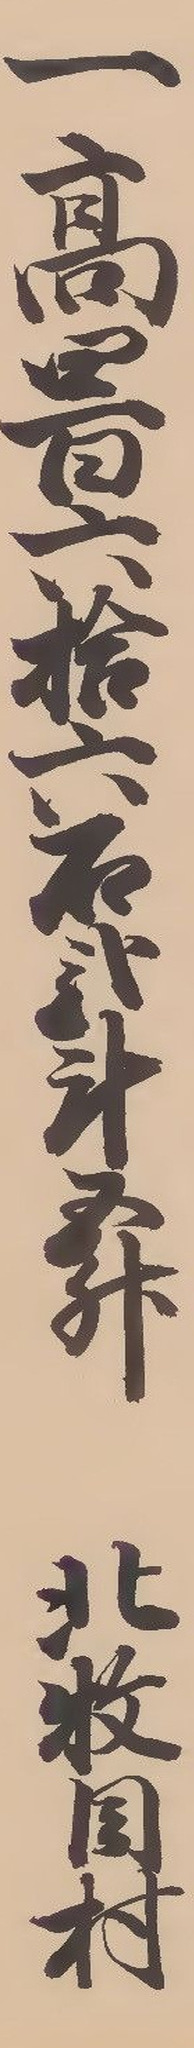一高四百六拾六石弐斗五升北牧目村

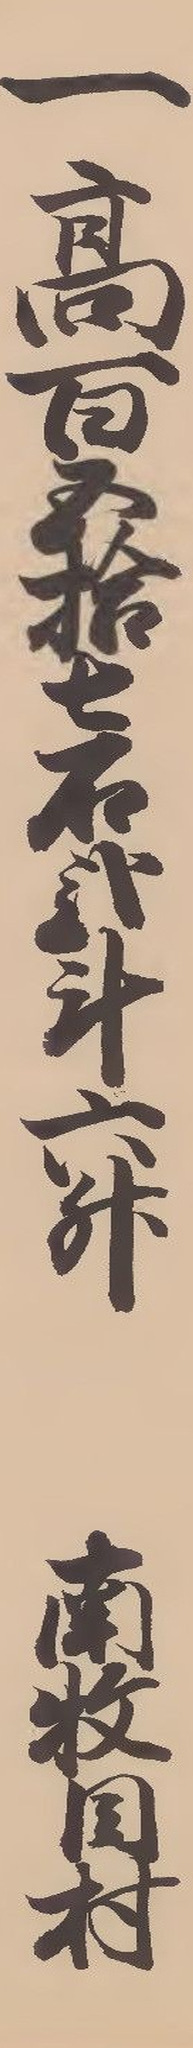一高百五拾七石弐斗六升南牧目村
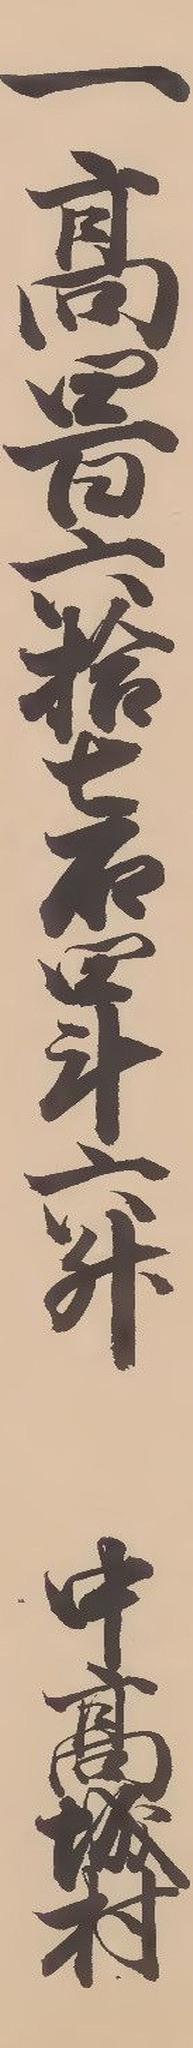一高四百六拾七石四斗六升中高城村
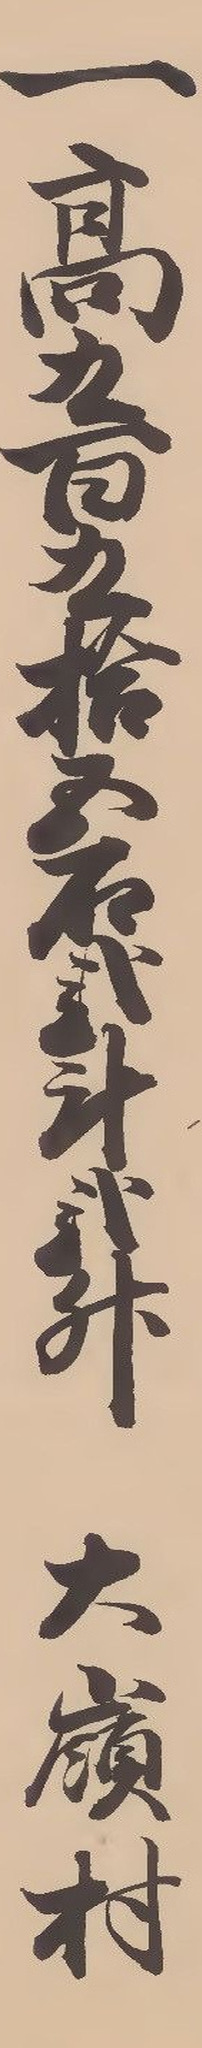一高九百九拾五石弐斗弐升大嶺村
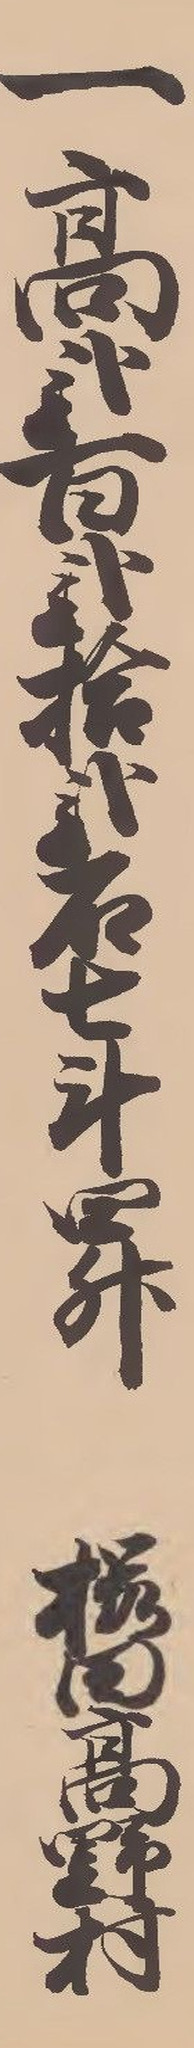一高弐百弐拾弐石七斗四升桜田高野村
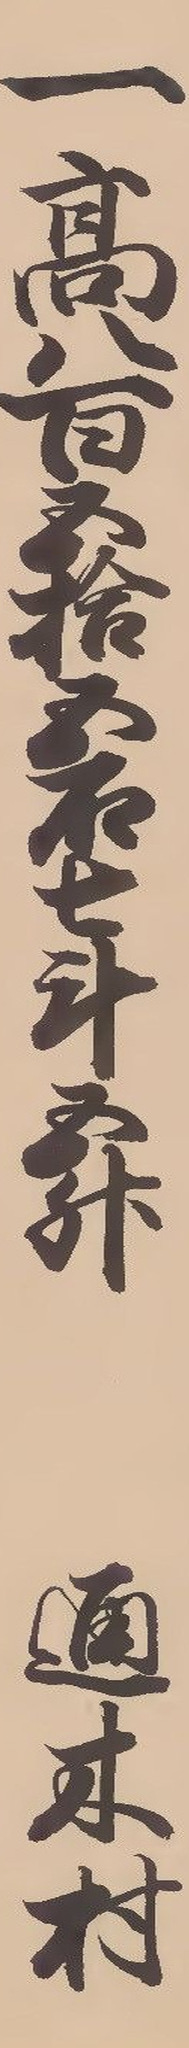一高八百五拾五石七斗五升通木村
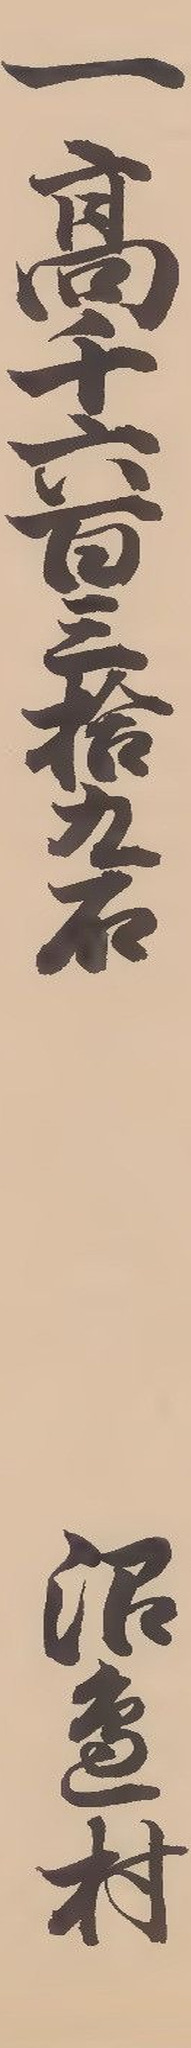一高千六百三拾九石沼辺村
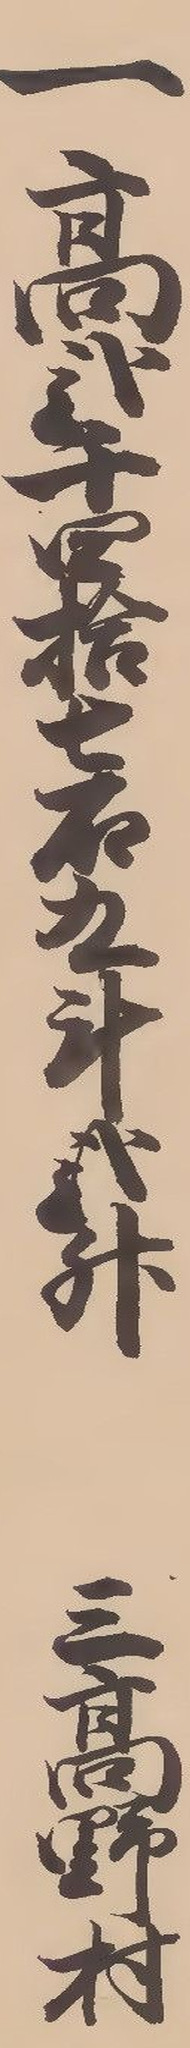一高弐千四拾七石九斗弐升三高野村
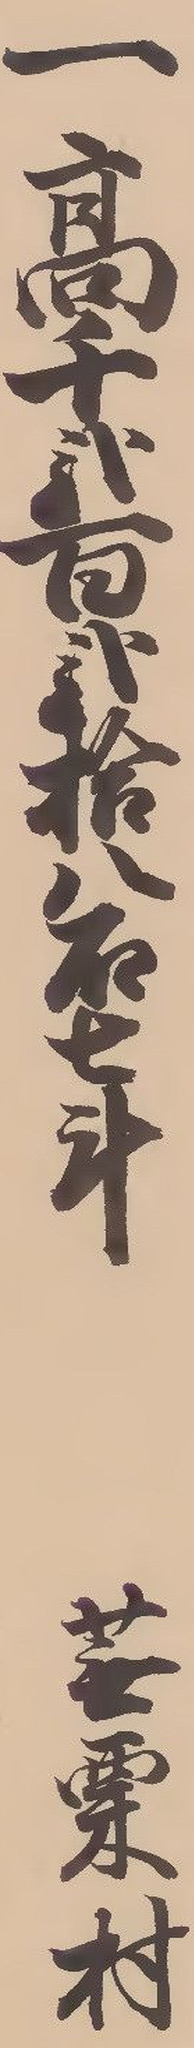一高千弐百弐拾八石七斗蕪栗村
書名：陸奥国郷帳　５
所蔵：国立公文書館 National Archives of Japan
